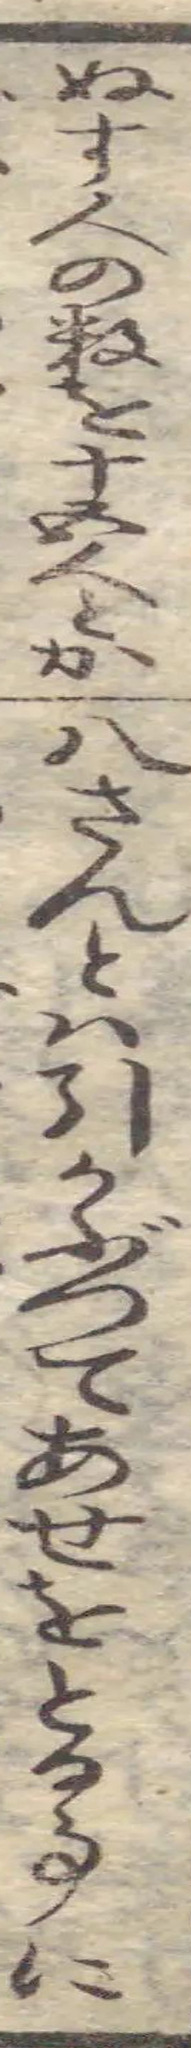ぬす人の数を十五人とか
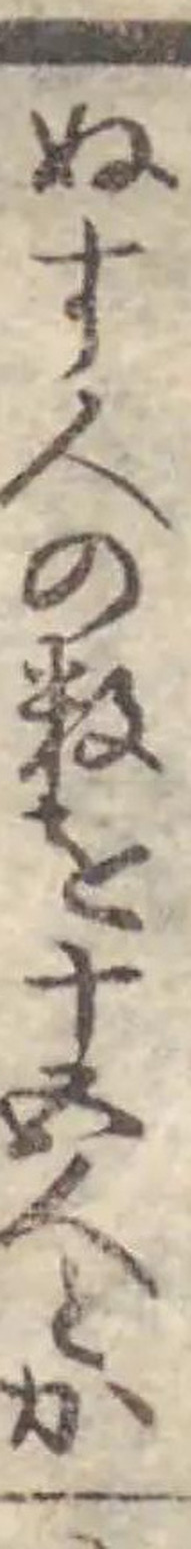ぬす人の数を十五人とか
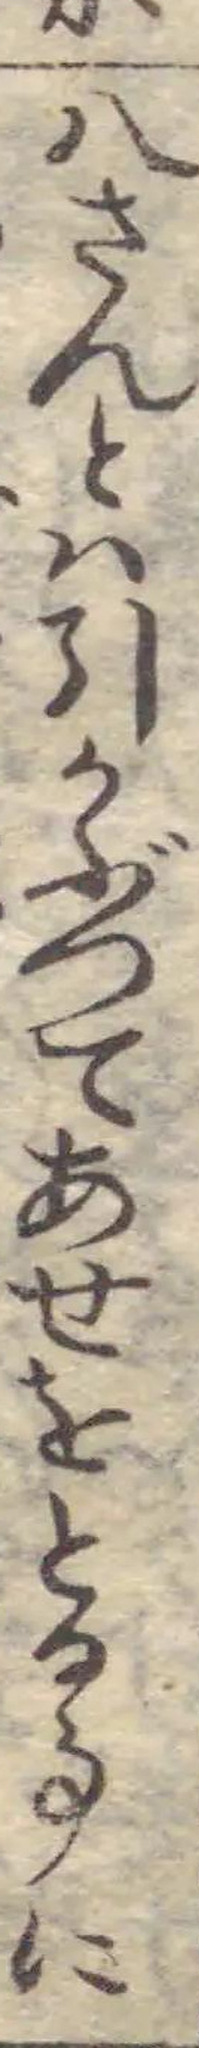八さんとは引かぶつてあせをとる事に
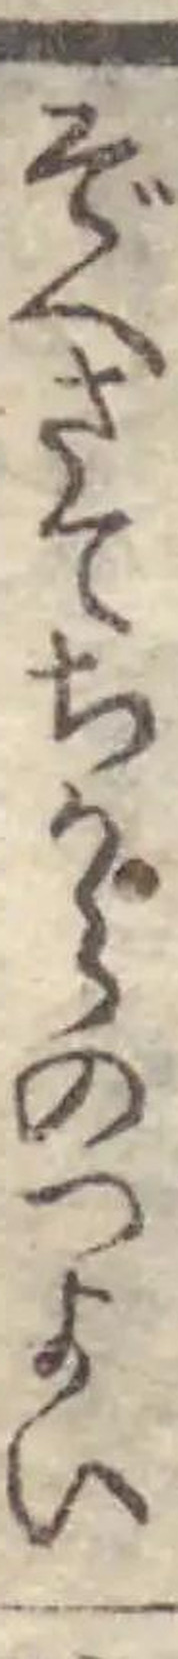ぞへさてちからのつよい
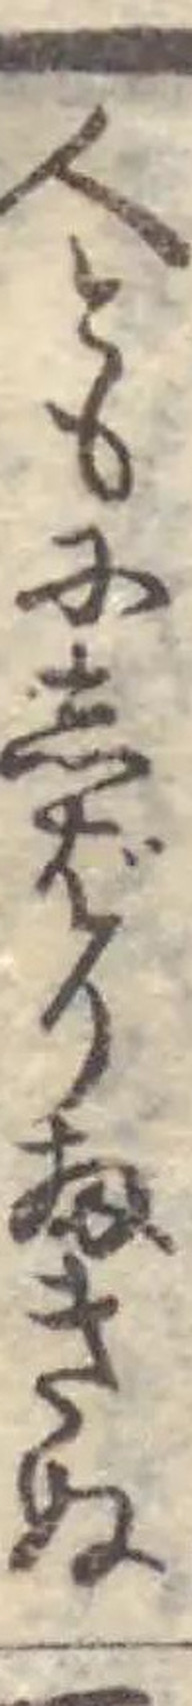人ともにしばり扨きぬ
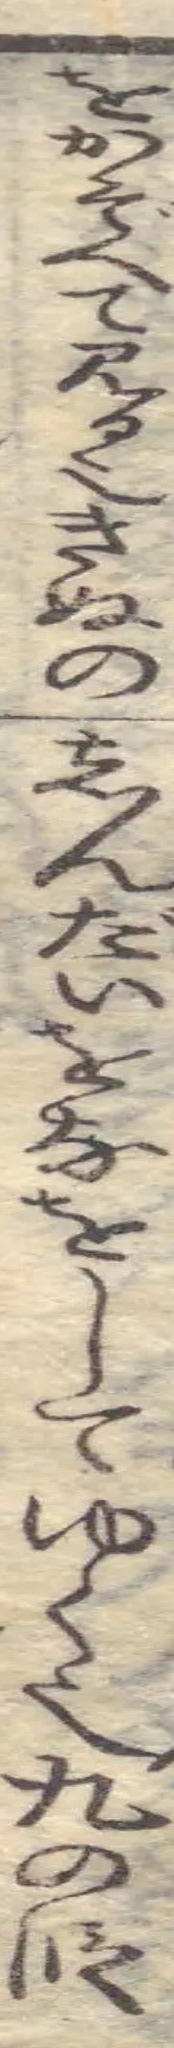をかぞへて見る也きぬの
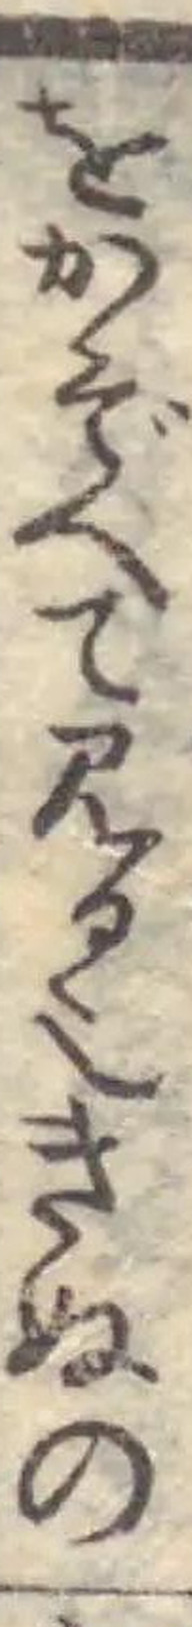をかぞへて見る也きぬの
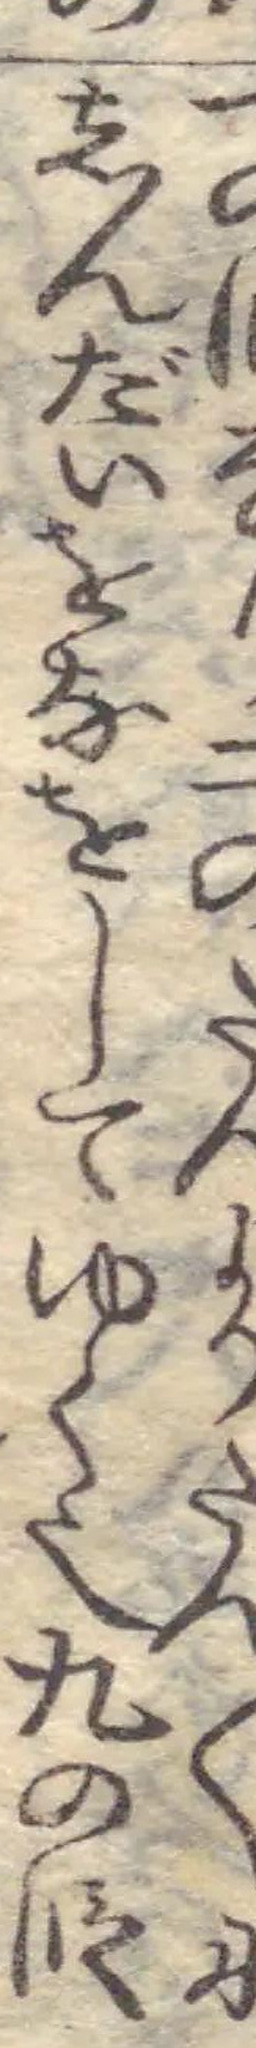しんだいをなをしてゆく也九の段
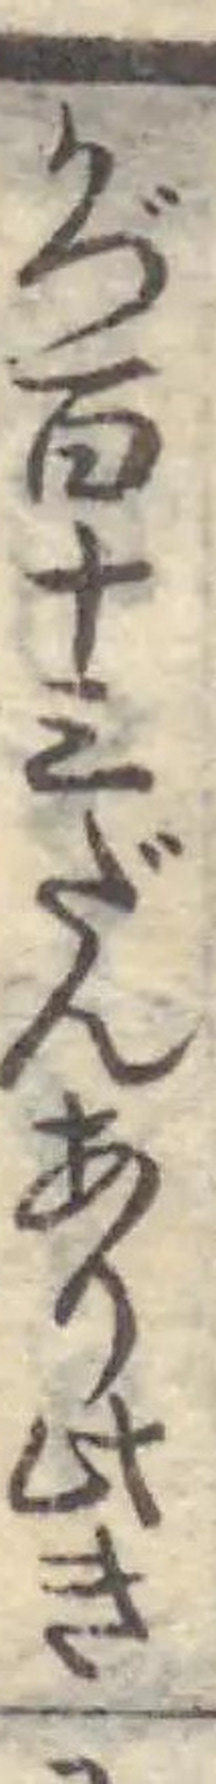かづ百十三だんあり此き
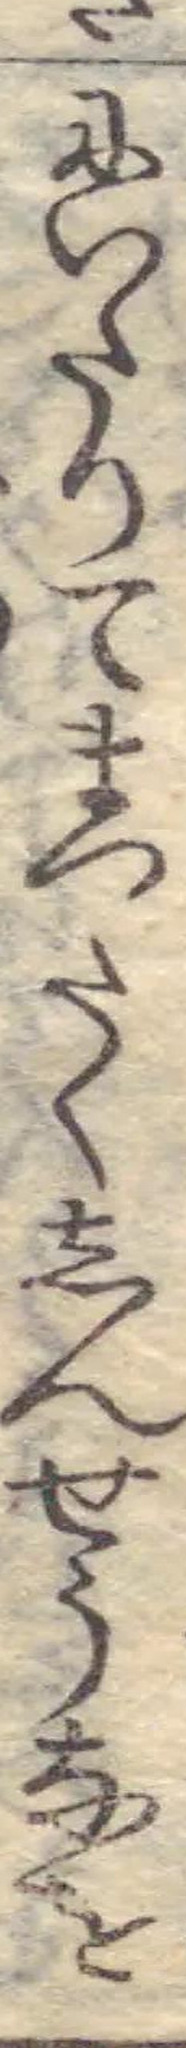にいたりてまつたくしんせうなを
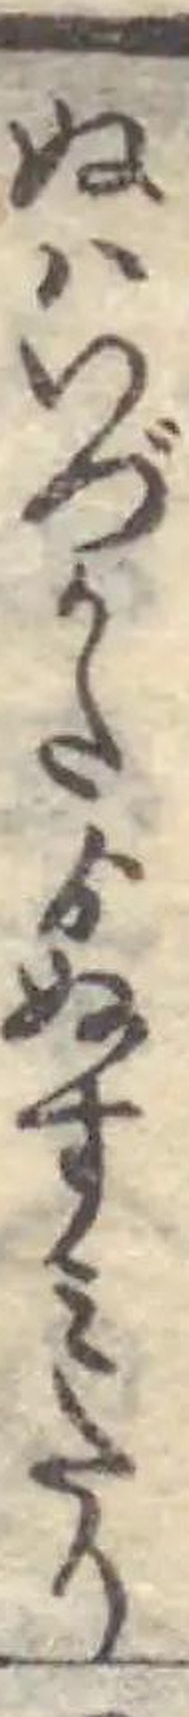ぬはいづかたよりぬすみたり
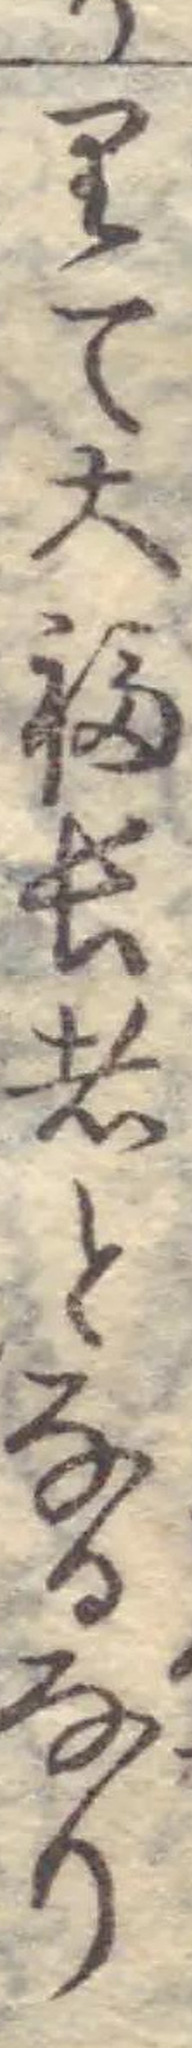りて大福長者となるなり
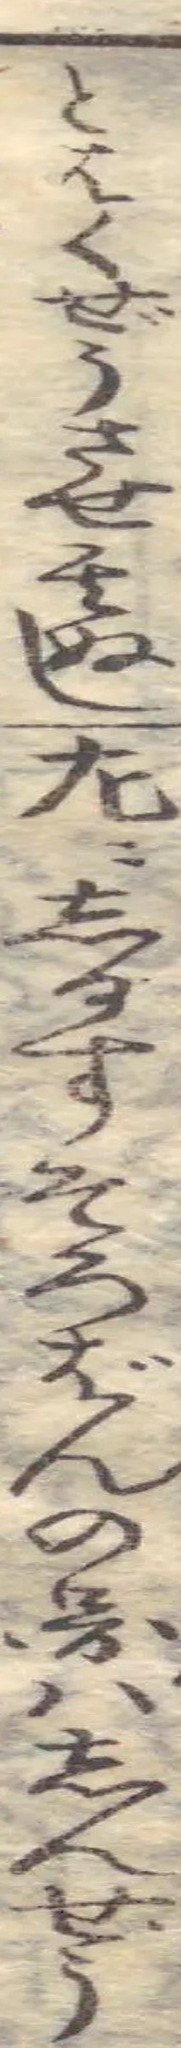とはくぜうさせ其ぬし
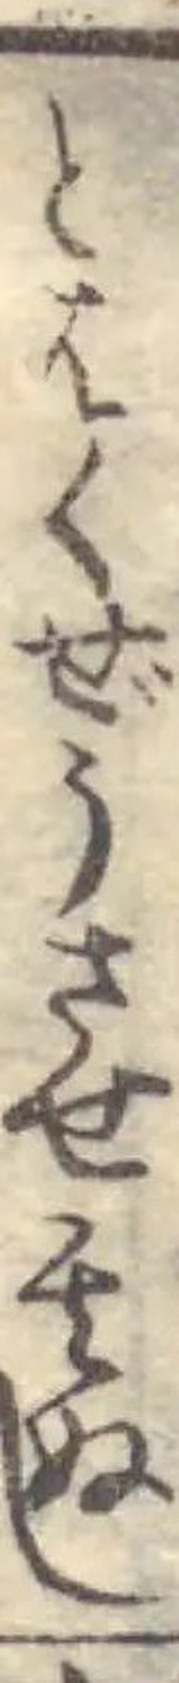とはくぜうさせ其ぬし
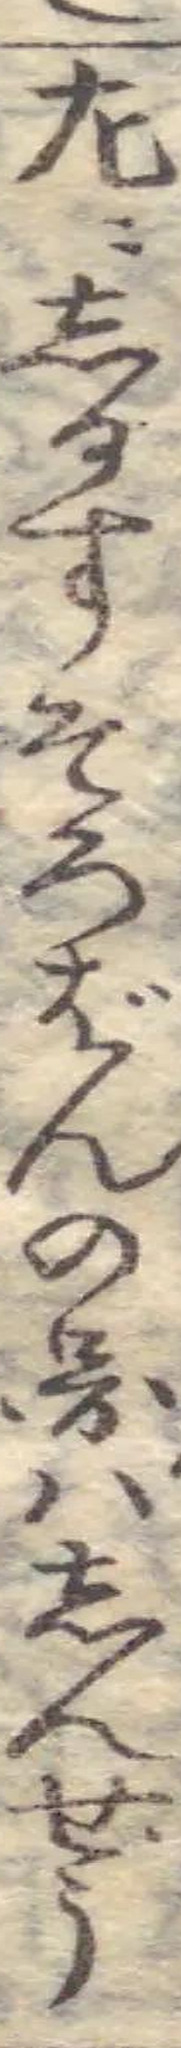左にしるすそろばんの図はしんせう
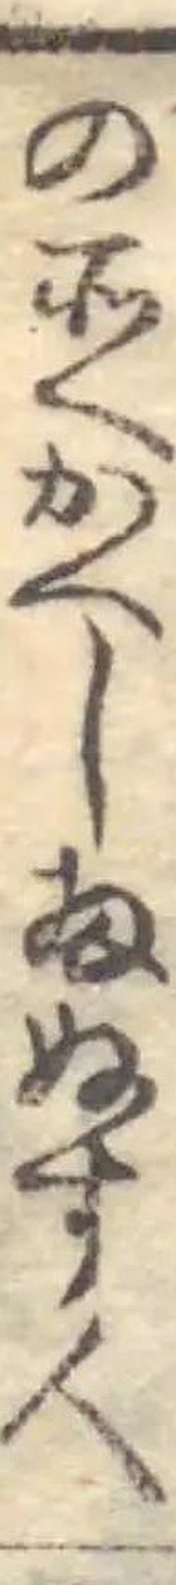の所へかへし扨ぬす人
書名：大通人好記
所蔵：国立国会図書館 National Diet Library, JAPAN
